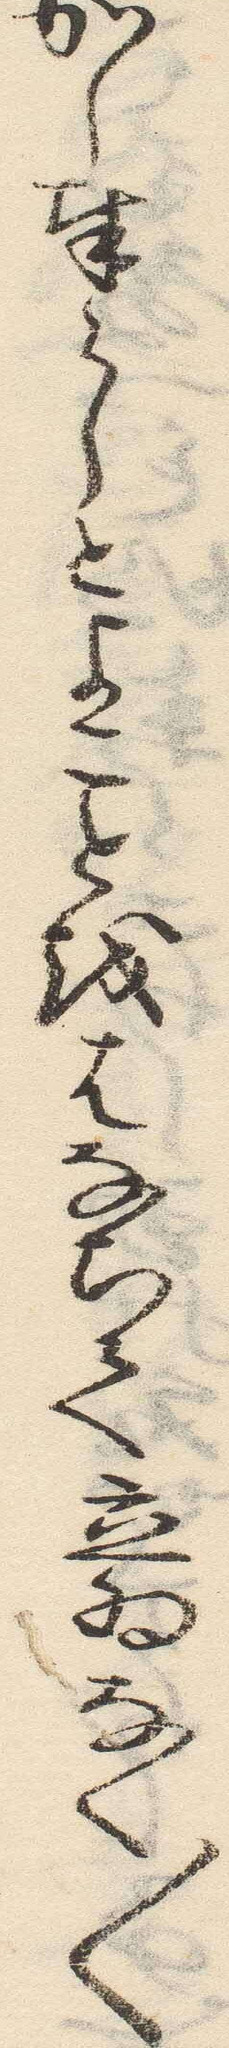かし奉らしとよことをはなちて立ゐなく〳〵
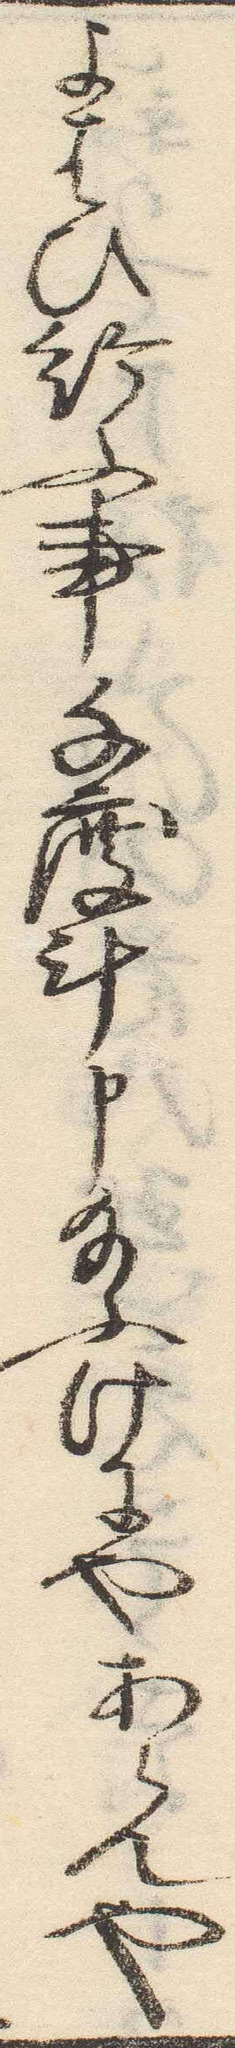よはひ給ふ事千度計申給ふけにやあらんや
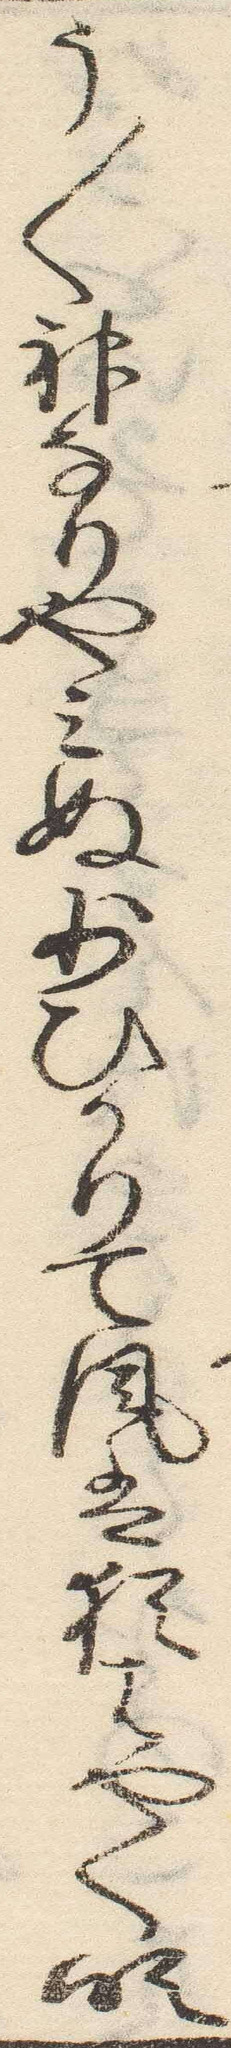う〳〵神やみぬ少ひかりて風は猶はやく吹
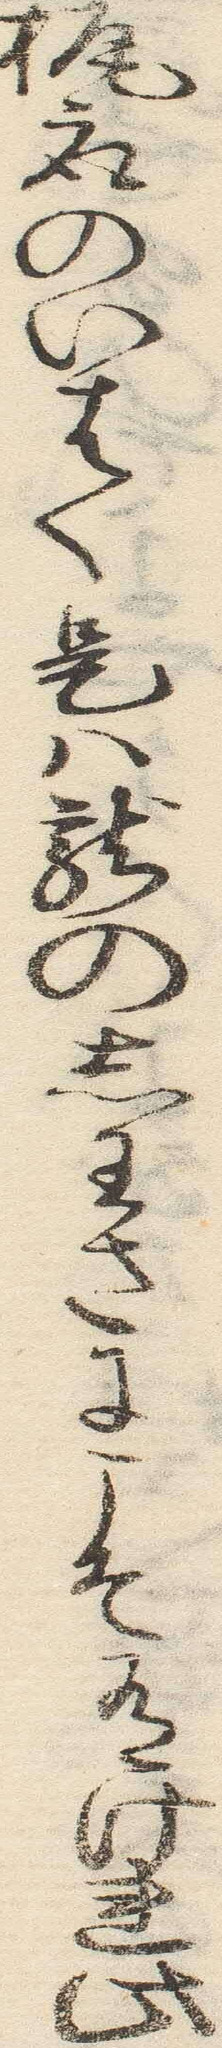梶取のいはく是は龍のしわさにこそ有けれ此
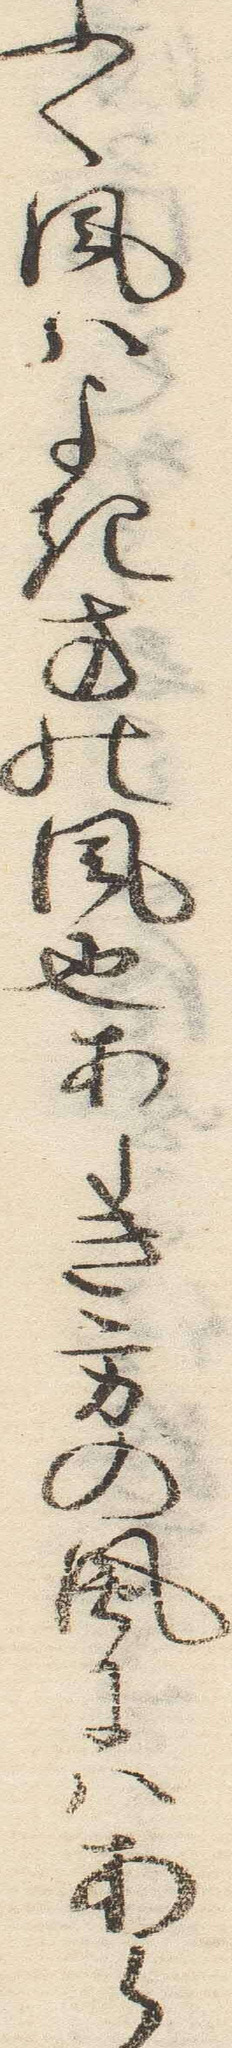ふく風はよき方の風なりあしき方の風にはあら
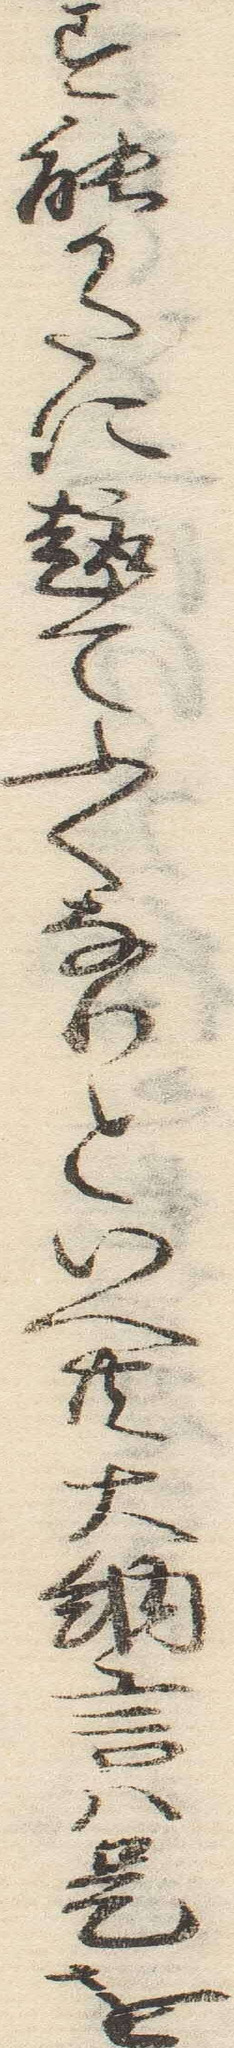す能かたに趣てふくなりといへ共大納言は是を
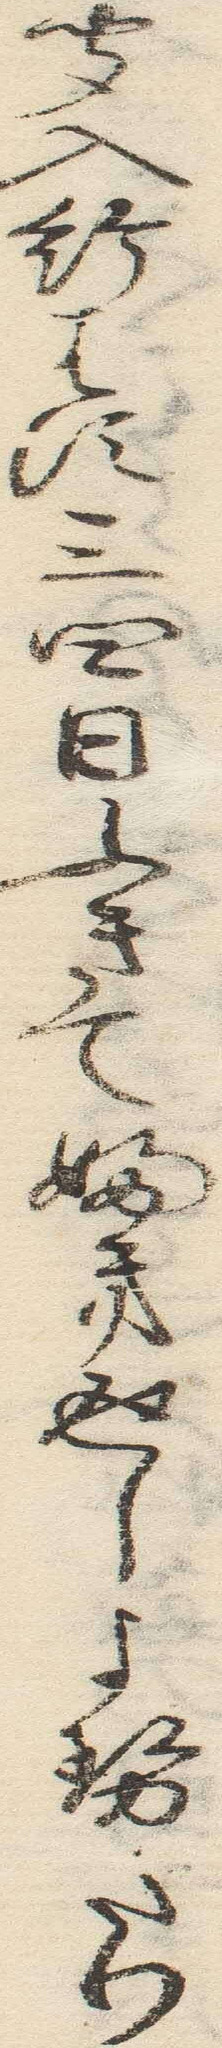聞入給はす三四日ふきてふき返しよせたり
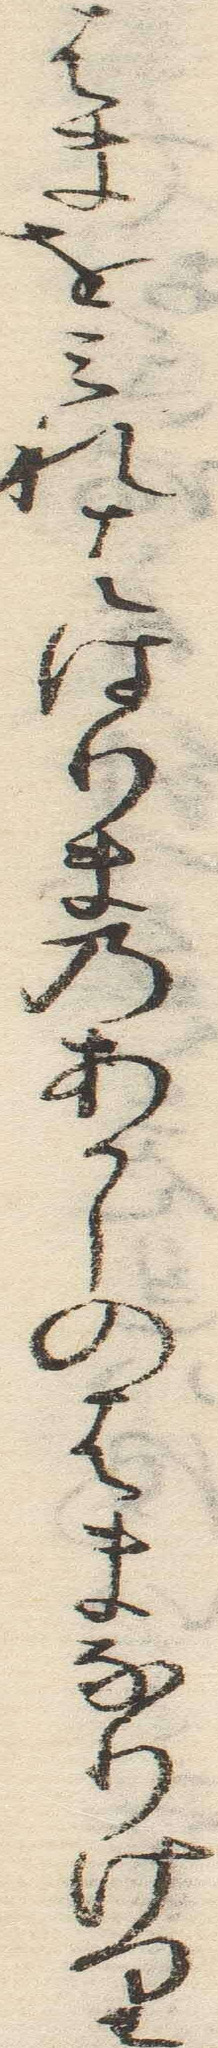はまをみれははりまのあかしのはまなりけり
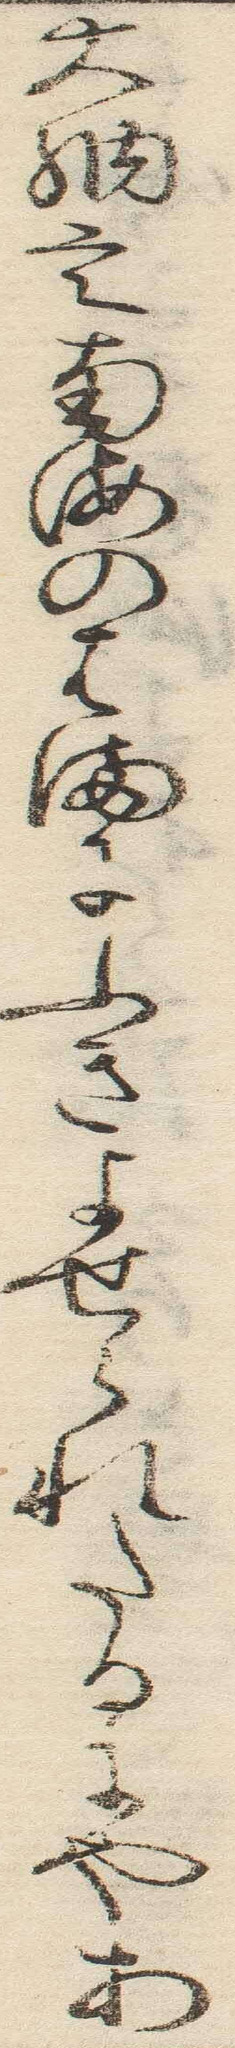大納言南海のはまにふきよせられたるにやあ
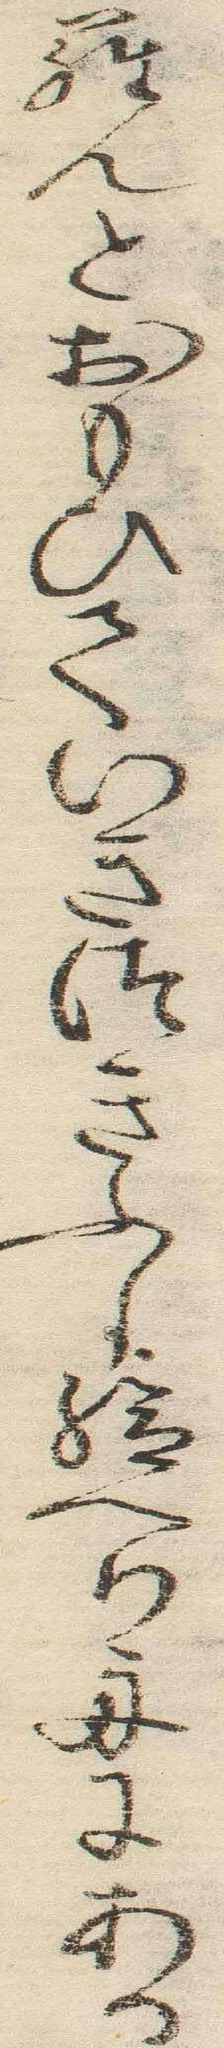らんとおもひていきつきふし給へり舟にある
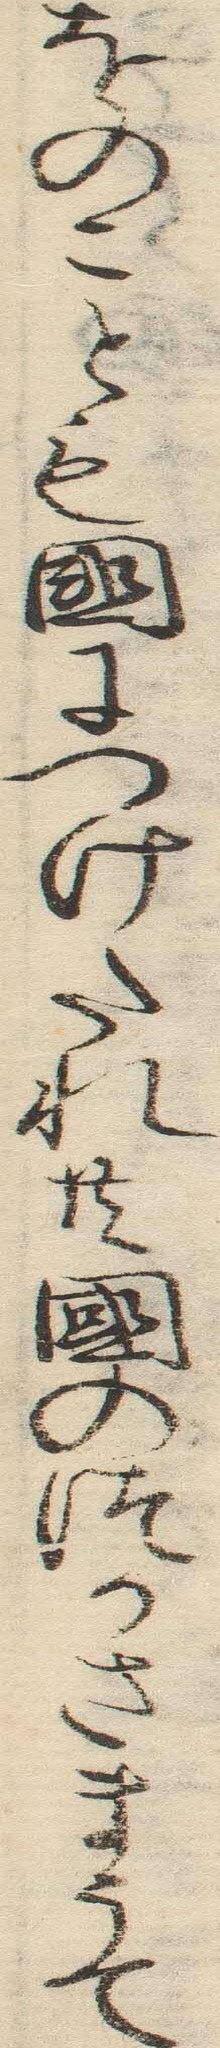をのことも国につけたれ共国のつかさまうて

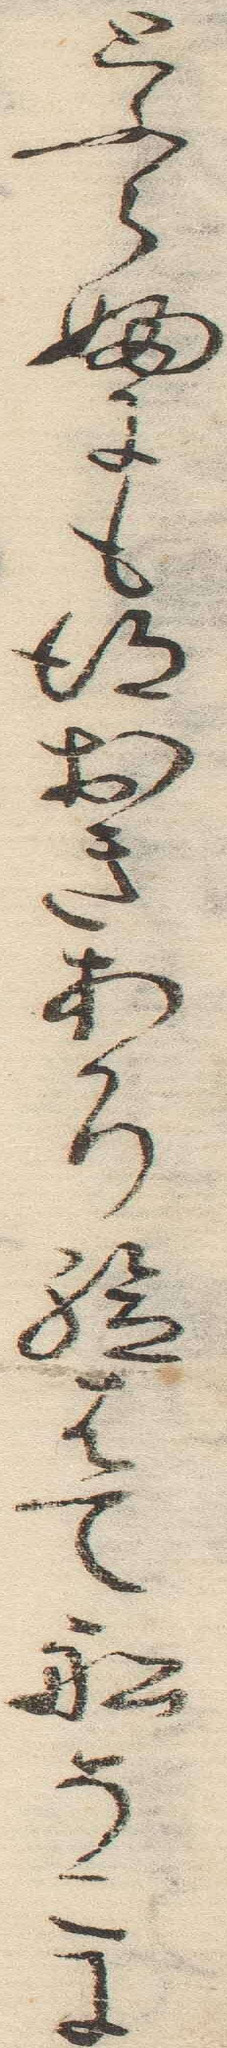とふらふにも得おきかり給はて船そこに
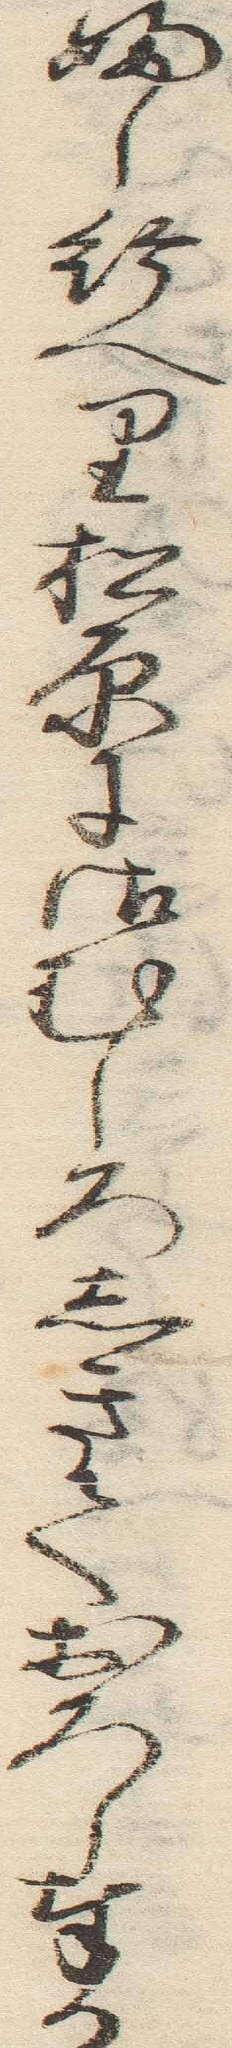ふし給へり松原にさむしろしきておろし奉る
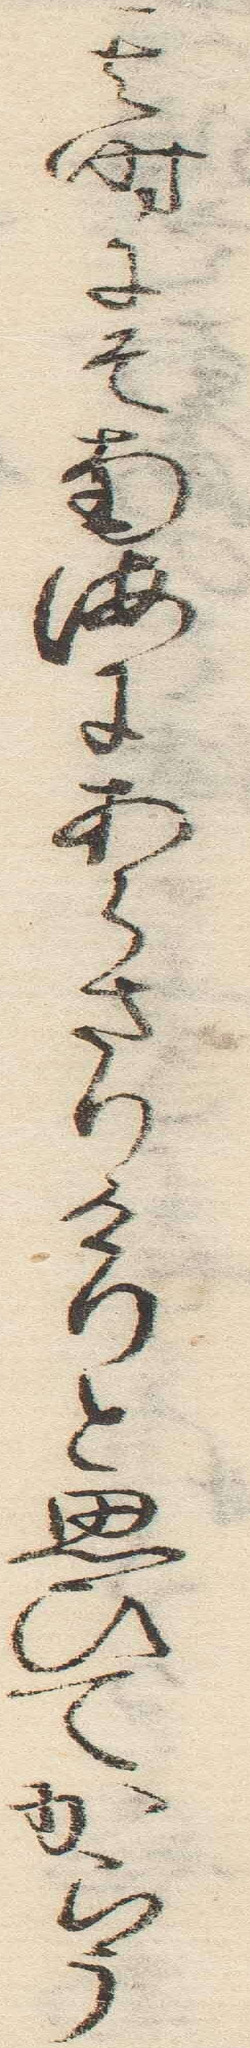其時にそ南海にあらさりけりと思ひてからう
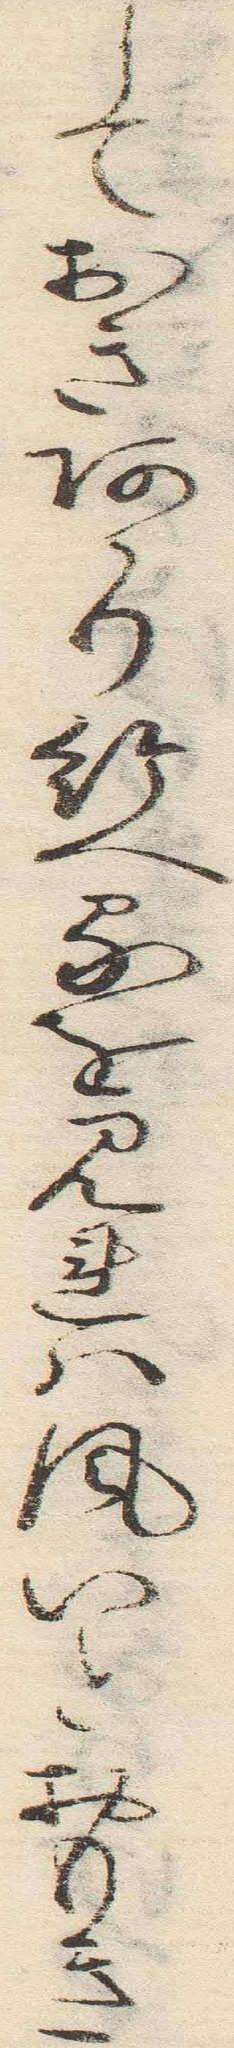しておきあかり給へるを見れは風いとおもき
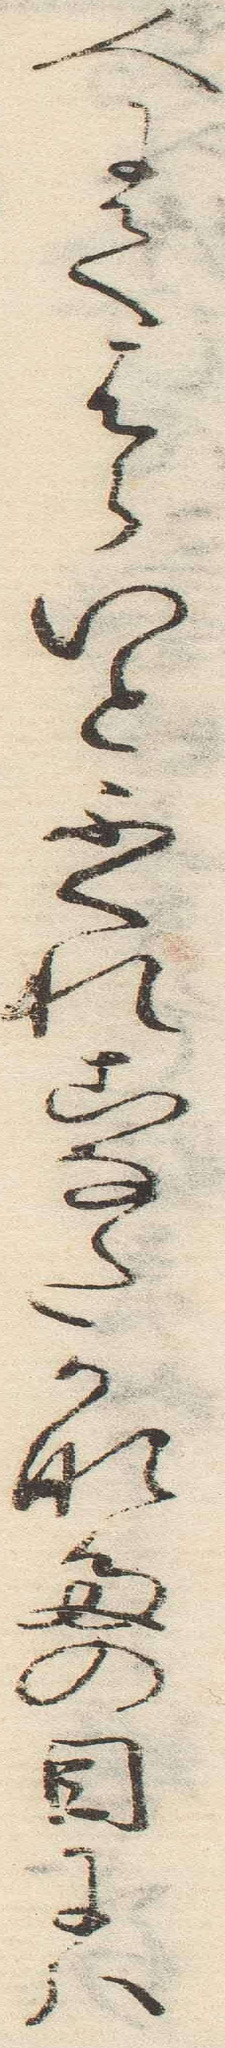人にてはらいとふくれこなたかなたの目には
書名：竹取物語
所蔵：東京学芸大学附属図書館 国文学研究資料館
